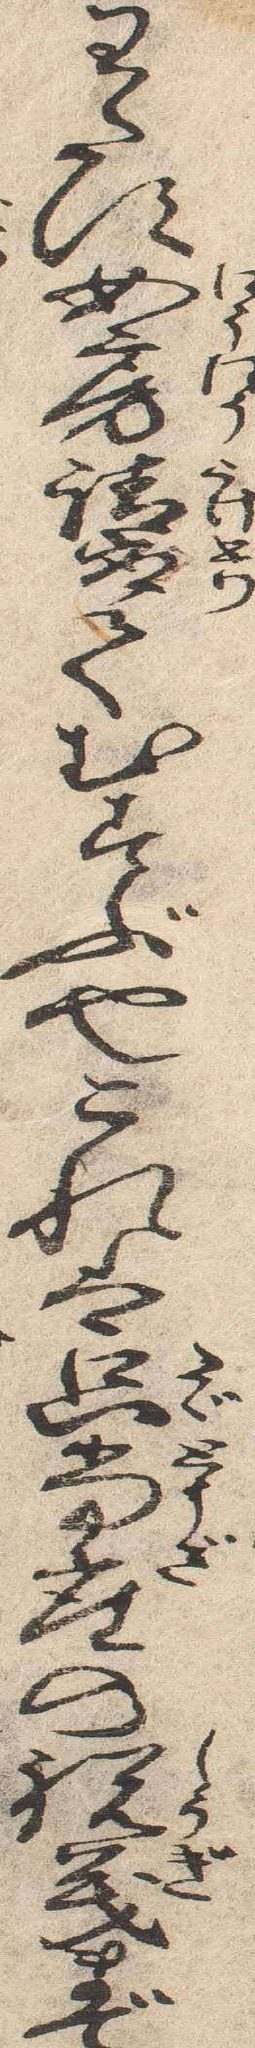わたす女房請取てむすぶ也これは只当座の祝義まで
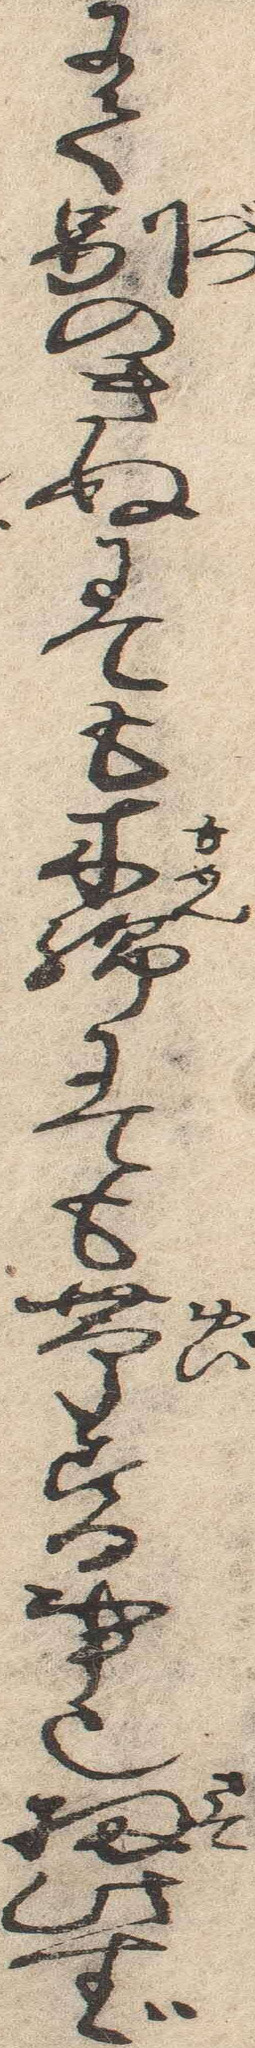にて別のきぬにても木綿にても帯する事也扨此すゞ
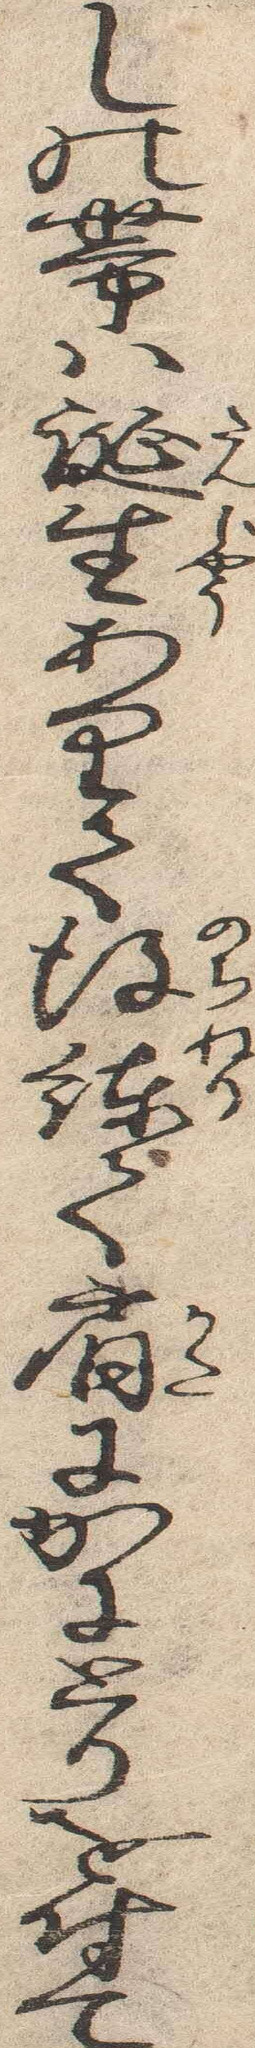しの帯は誕生ありて後練て肩にかにとりを付て
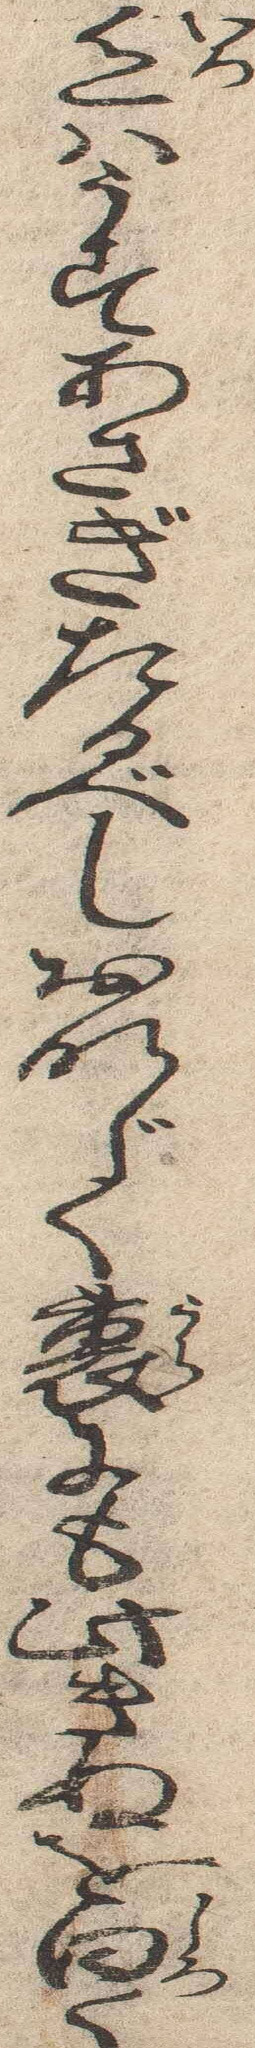色はうすあさぎたるべしおなじく裏にも此きぬを白く
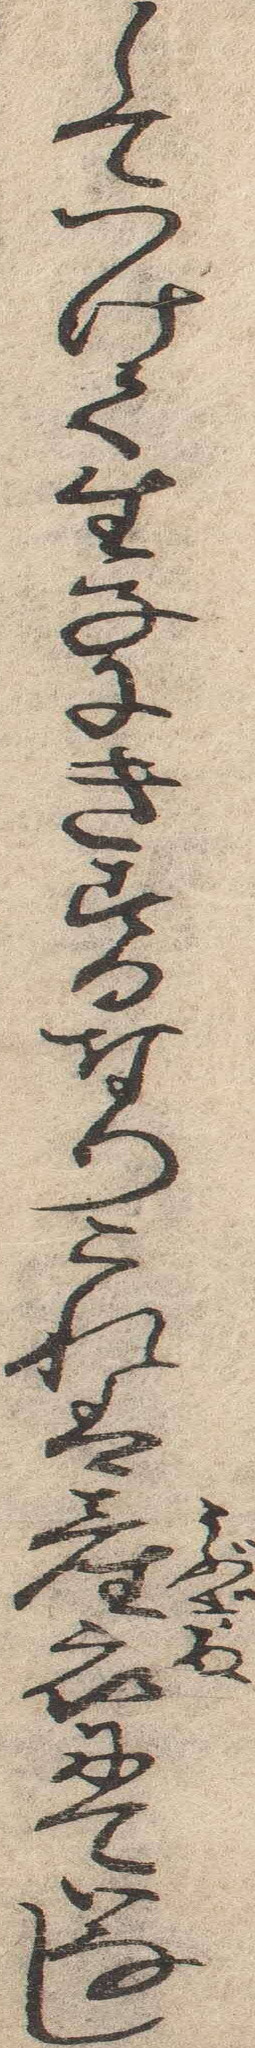してつけて生子にきするなりこれは産衣にてはなし

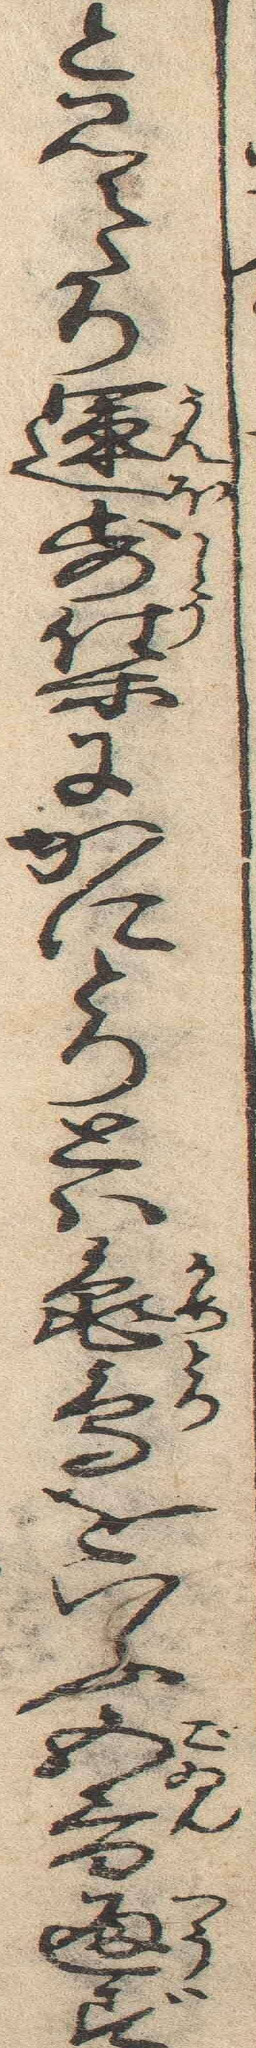と見えたり運歩集にかにとりとは龜鳥をいふ五音通ず
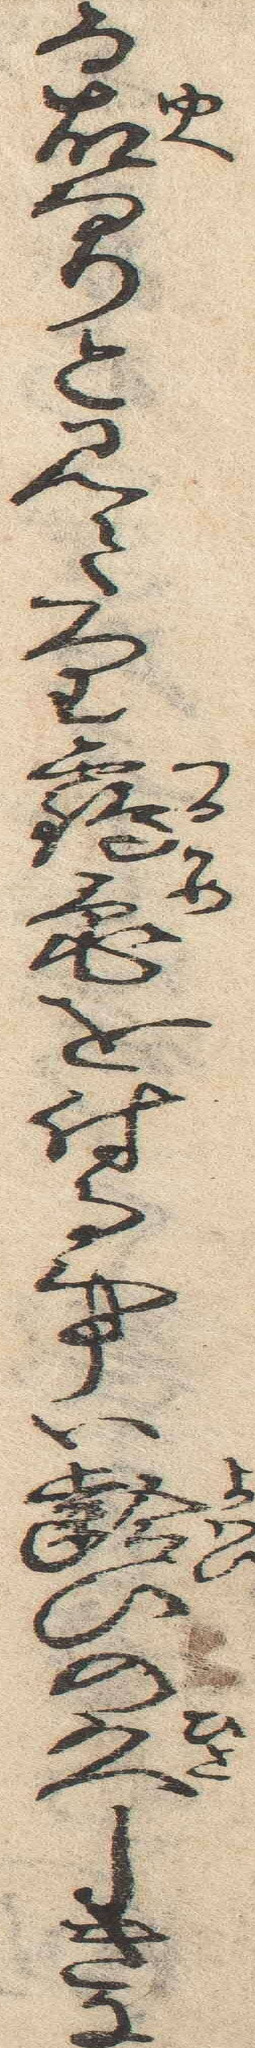る故なりと見えたり鸖龜を付る事は齡の久しきに
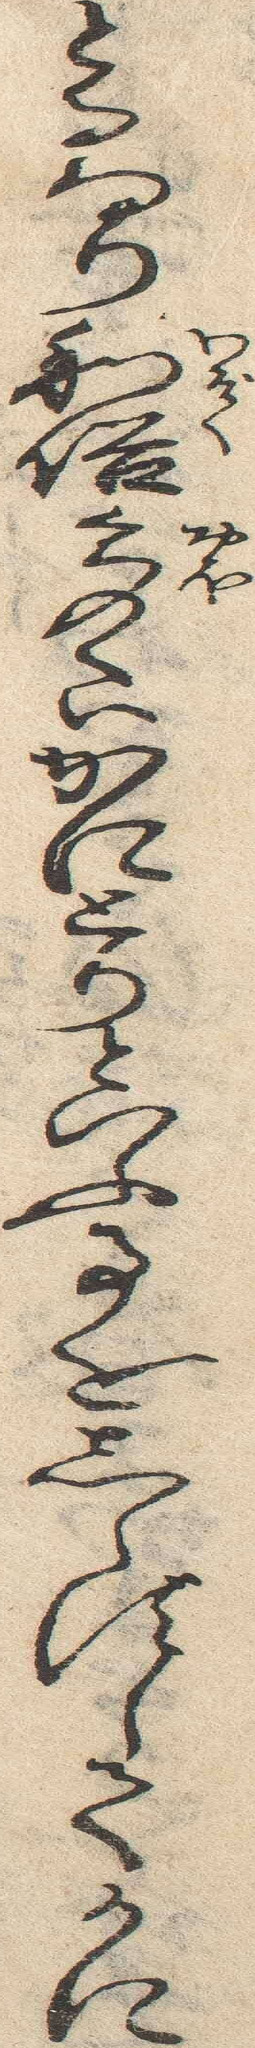とるなり和俗多くはかにとりといふ事をしらずしてかに
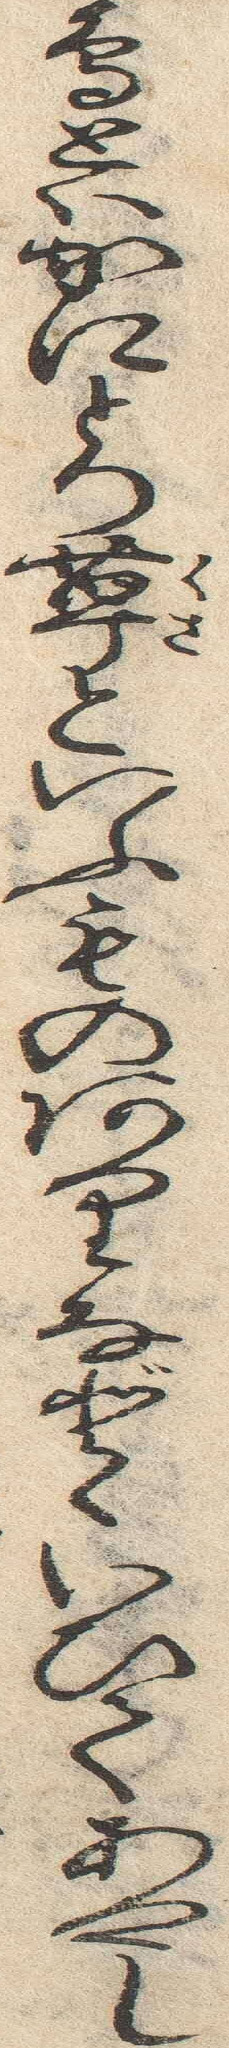鳥とはかにとり草といふものありなどゝいひてあやし
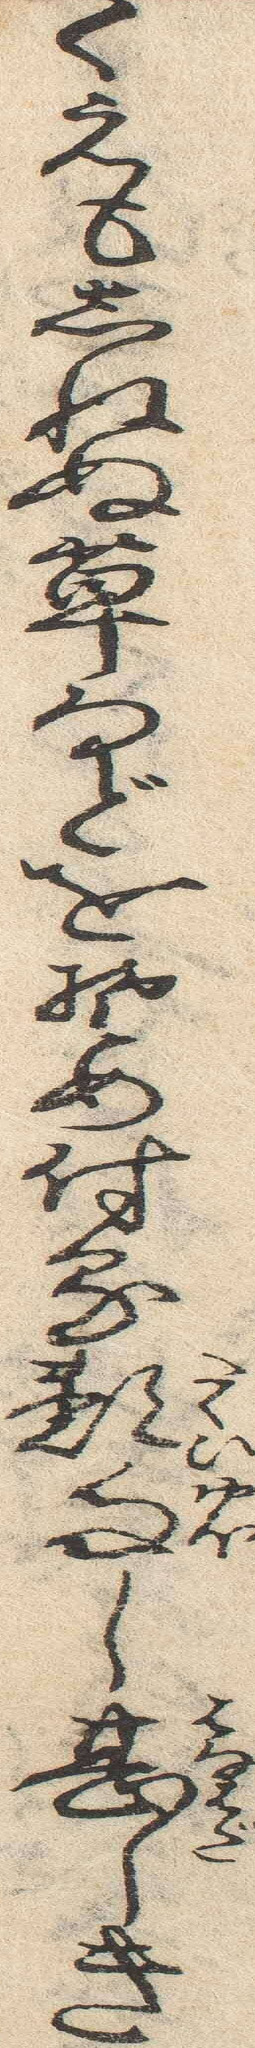く名もしれぬ草などをそめ付る類多し甚しき
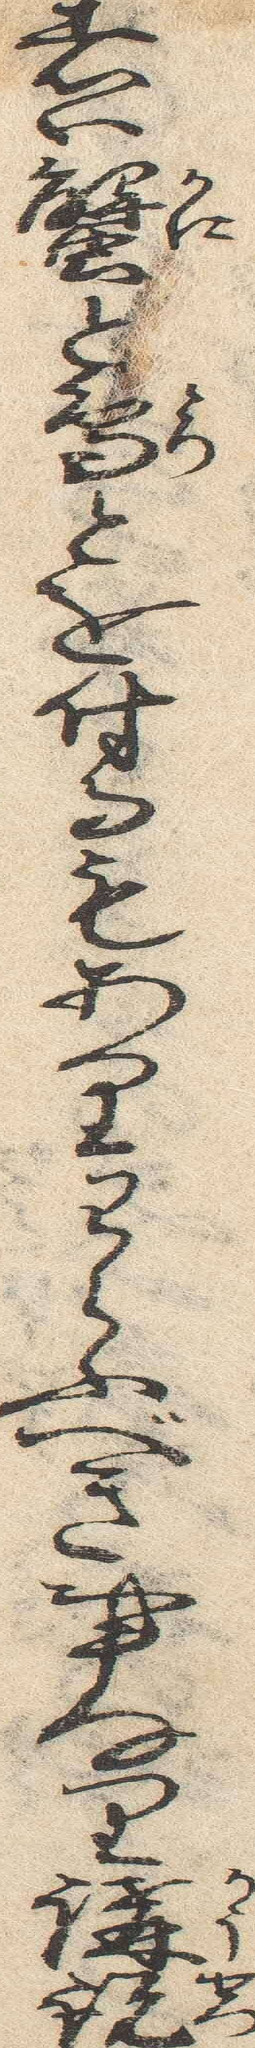者は蟹と鳥とを付るもありわらふべき事なり講説
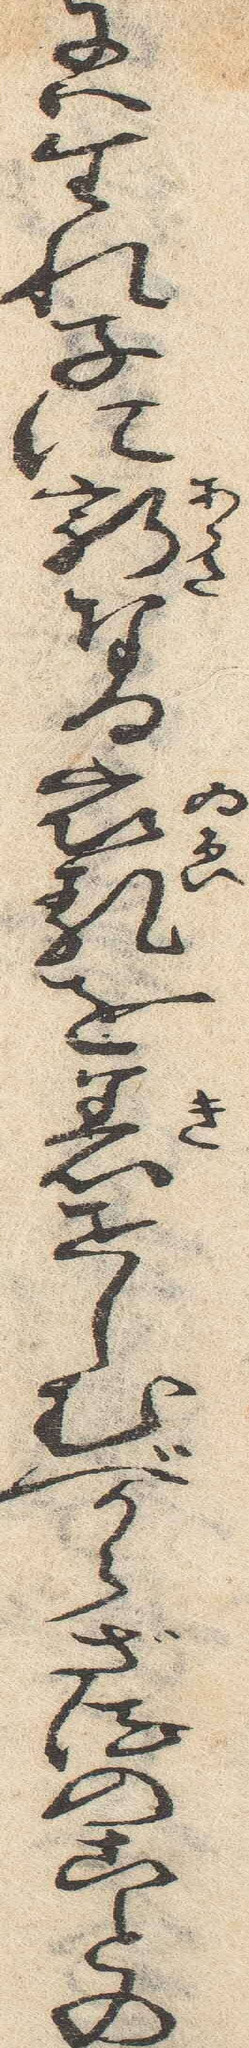には生れ子に新なる衣類を着せしむべからざるのことの
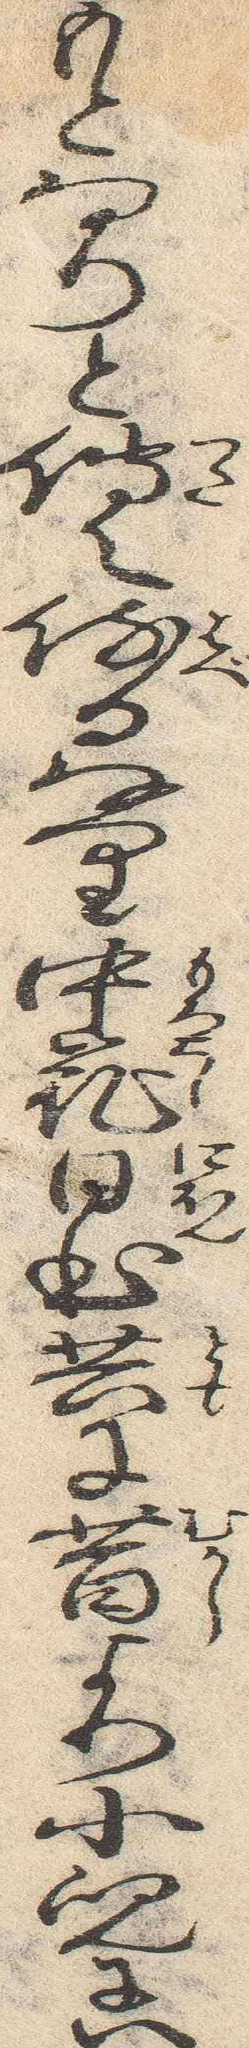もとなりと傳え侍るなり中花日本共に昔より小児には
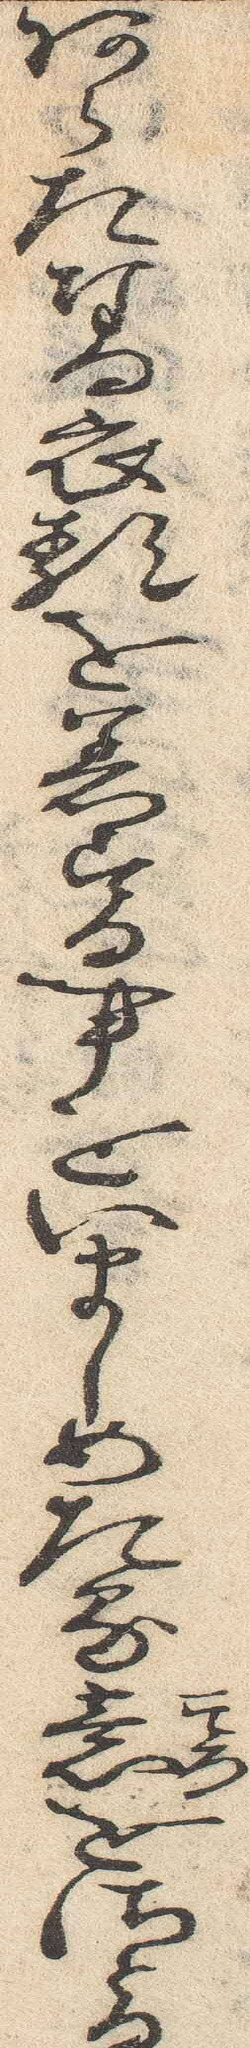あらたなる衣類を着する事をいましめたる意をさとる
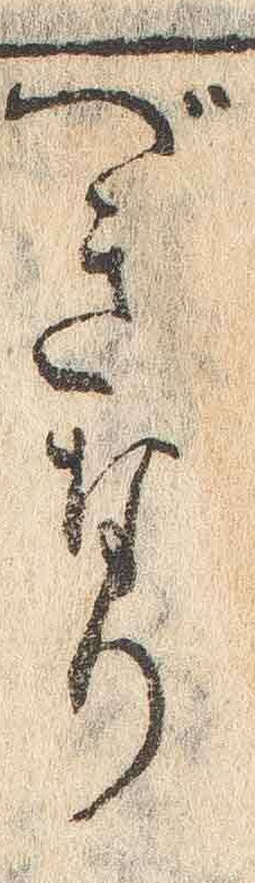べきなり
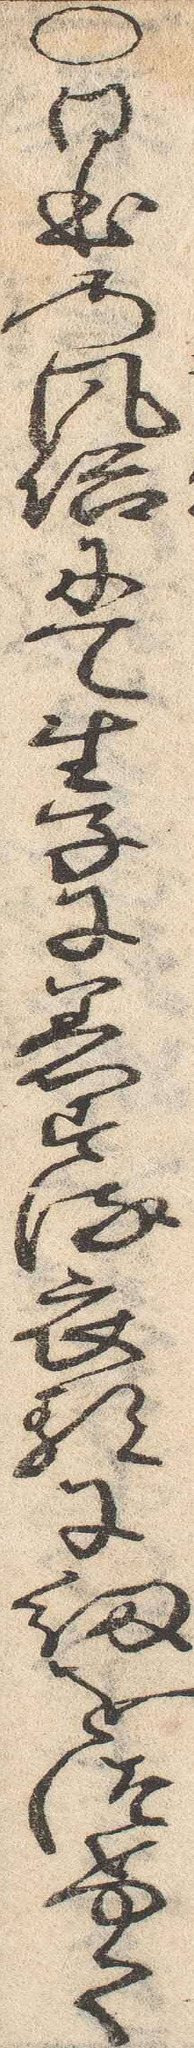◯日本の風俗にて生子に着する衣類に紐をつけて
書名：小児必用養育草
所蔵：東京学芸大学附属図書館 国文学研究資料館
